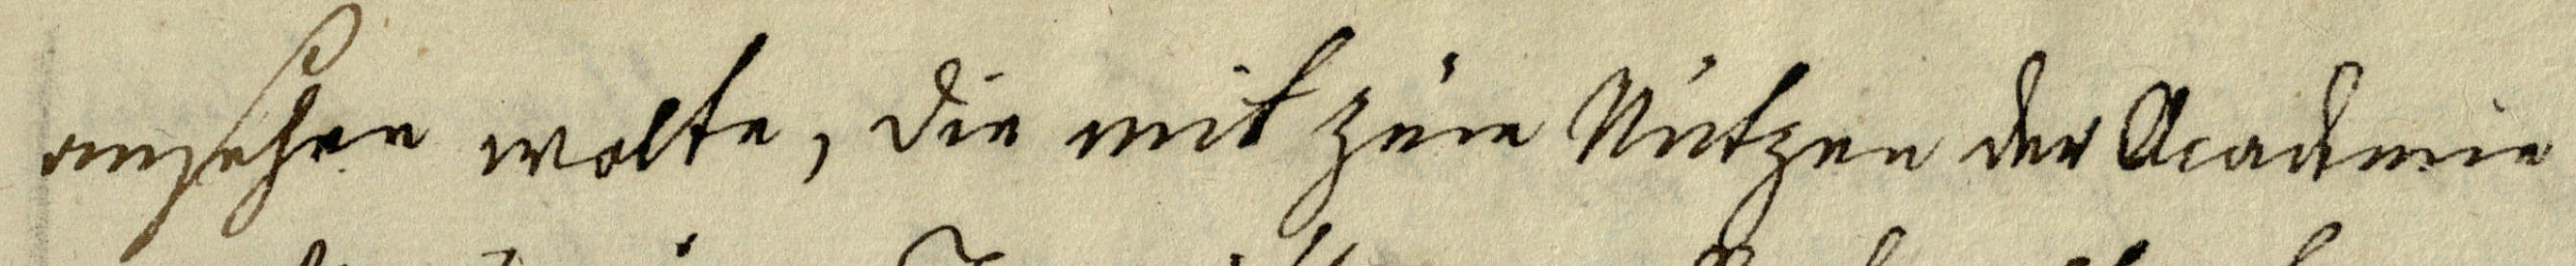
ansehen wolte, die mit zum Nutzen der Academie
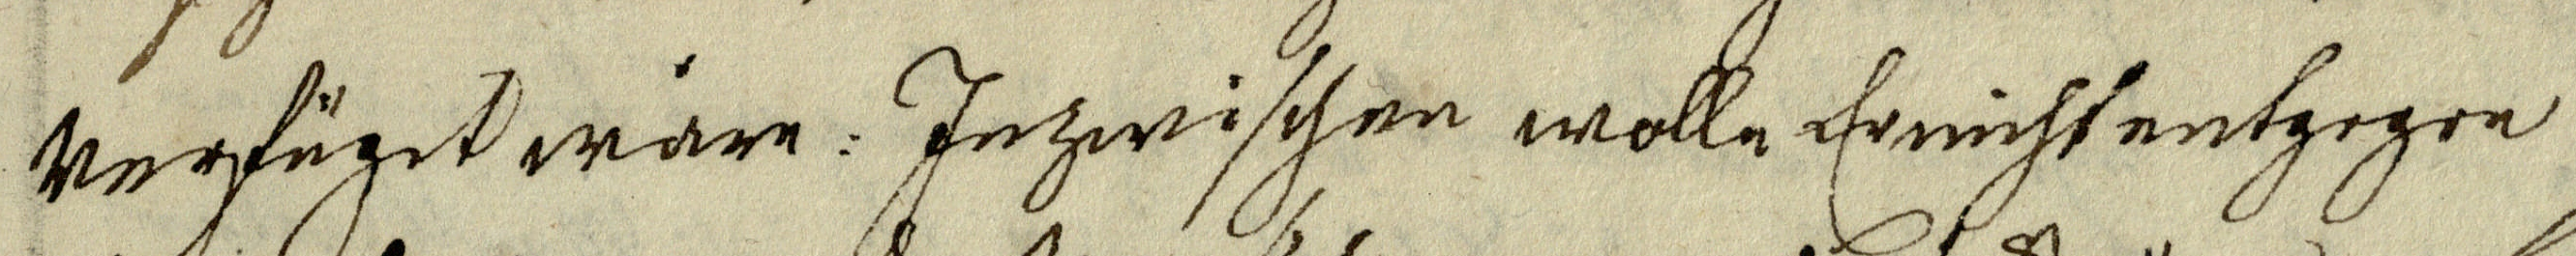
verfüget wäre: Inzwischen wolle Er nicht entgegen
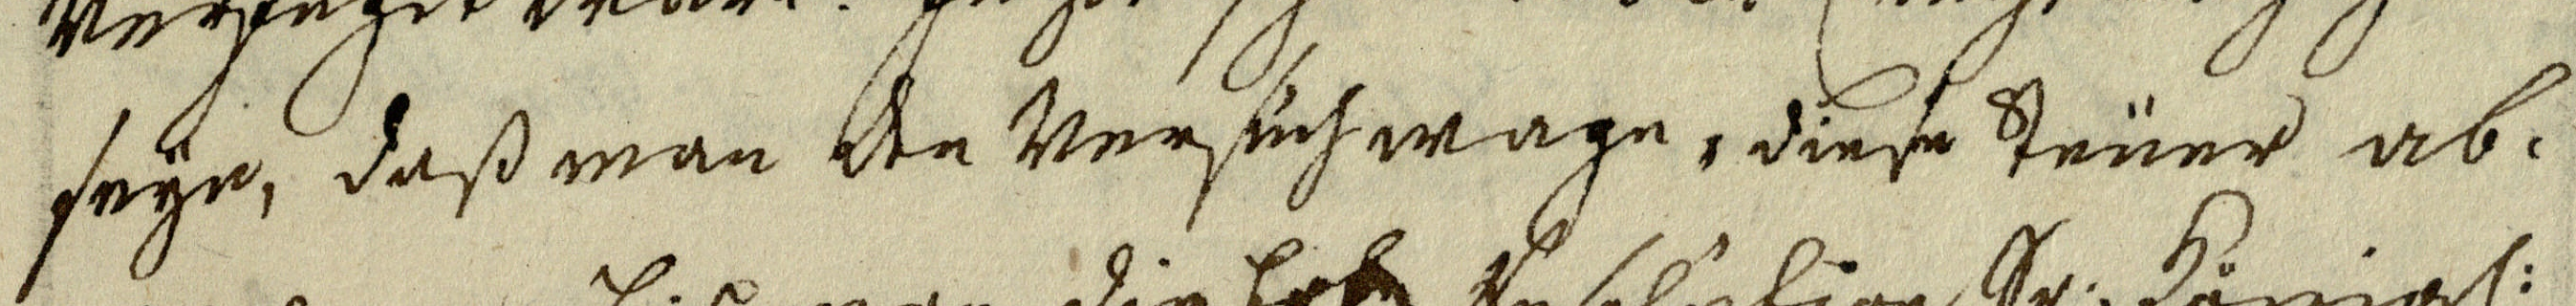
seÿn, daß man den Versuch wage, diese Steuer ab¬
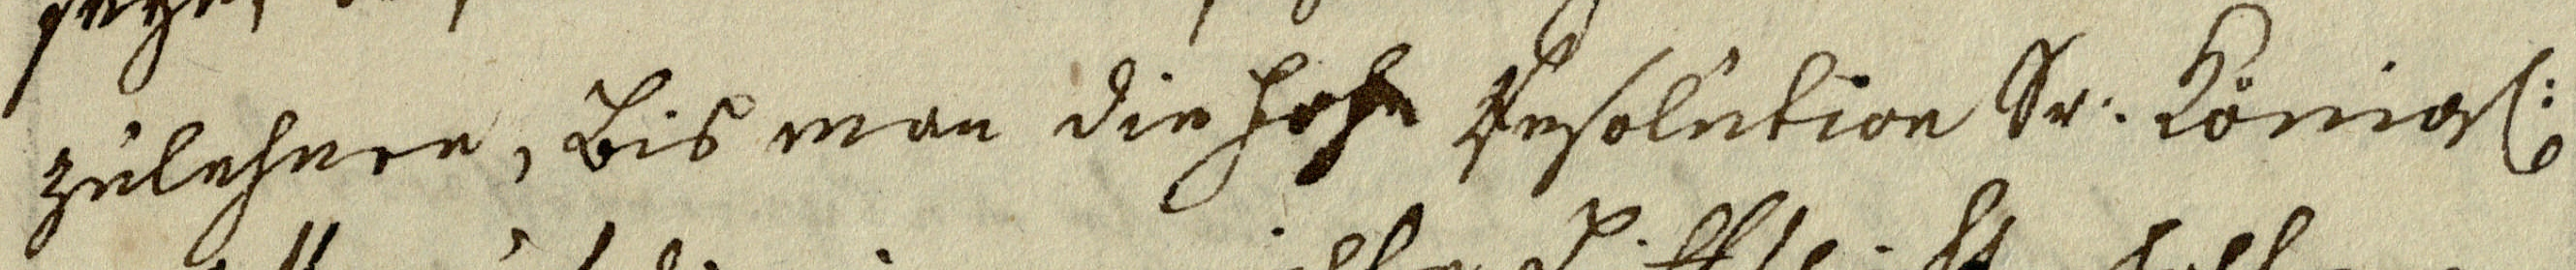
zulehnen, bis man die hohe Resolution Sr Königl.
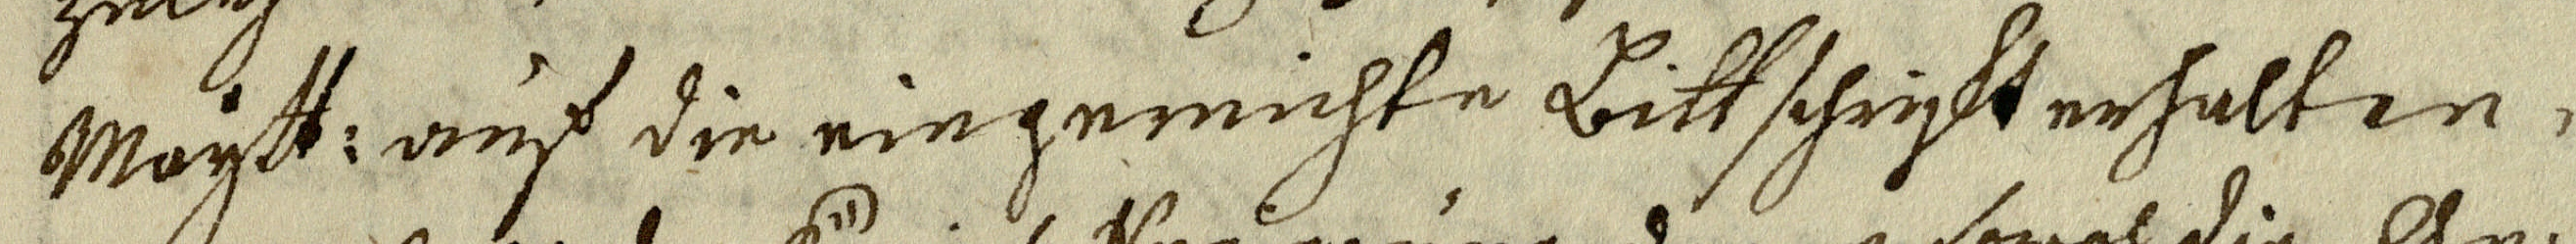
Maÿtt. auf die eingereichte Bittschrift erhalten,
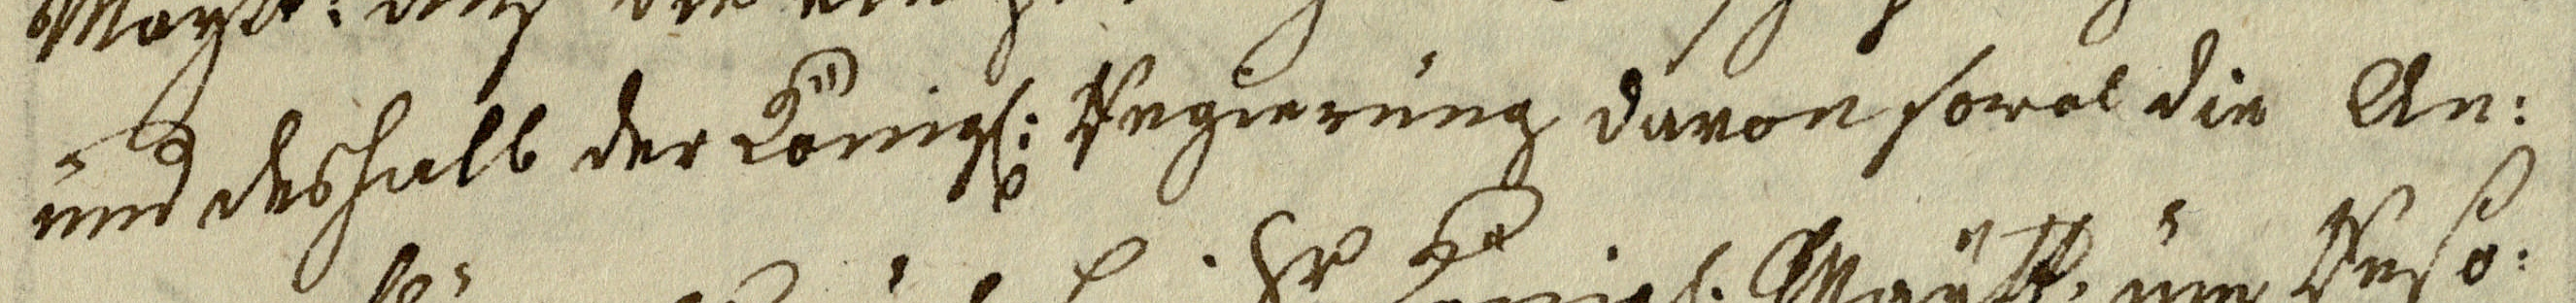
und deshalb der Königl. Regierung davon sowol die An¬
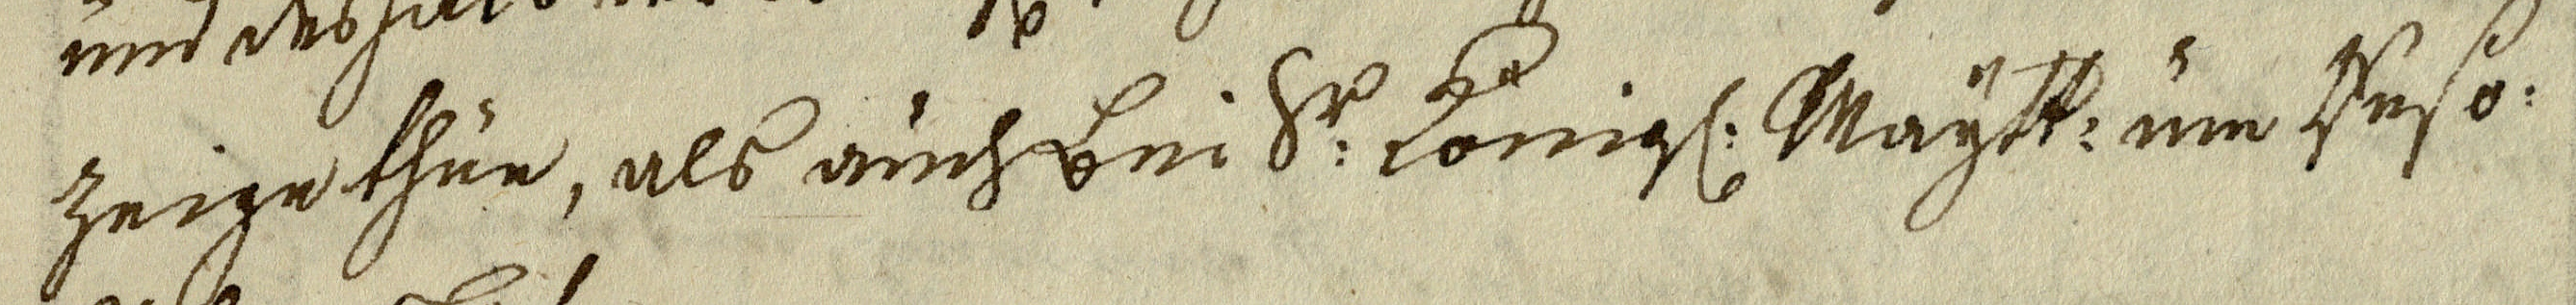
zeige thue, als auch bei Sr Königl. Maÿtt. um Reso¬
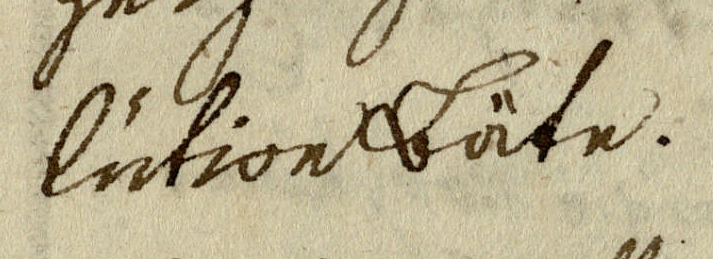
lution bäte.
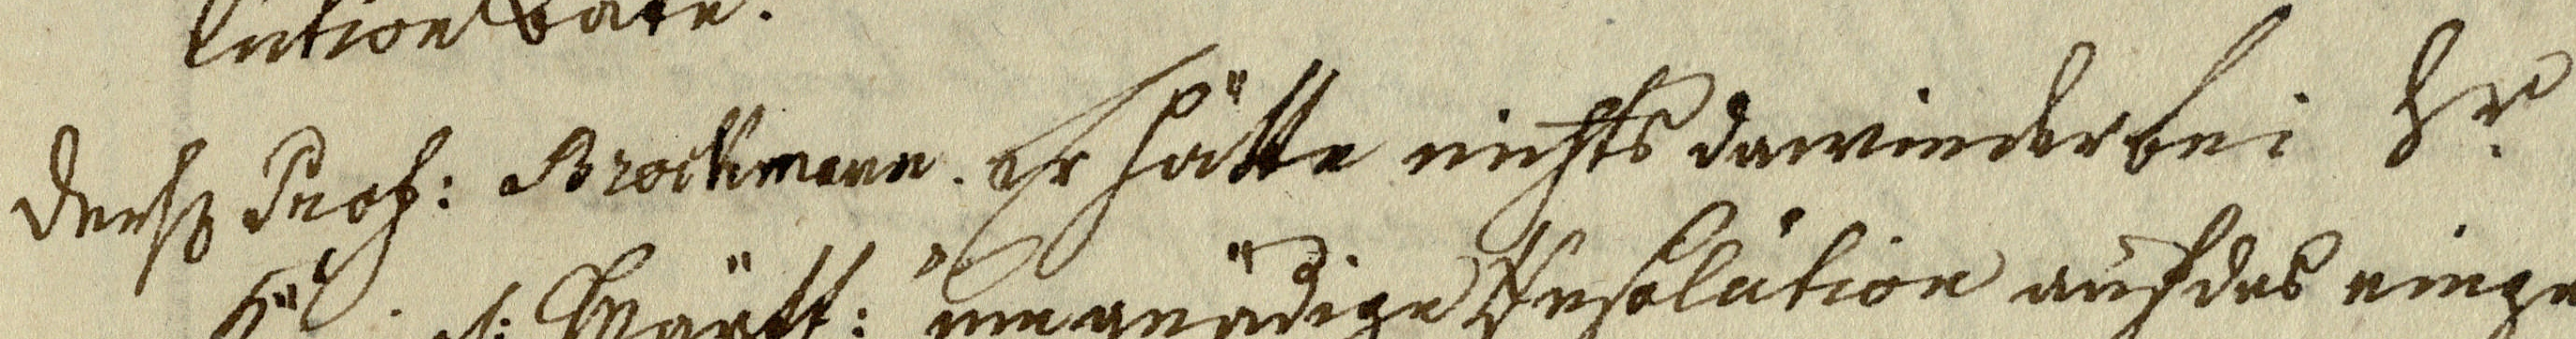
Derh. Prof. Brockmann. Er hätte nichts dawieder bei Sr
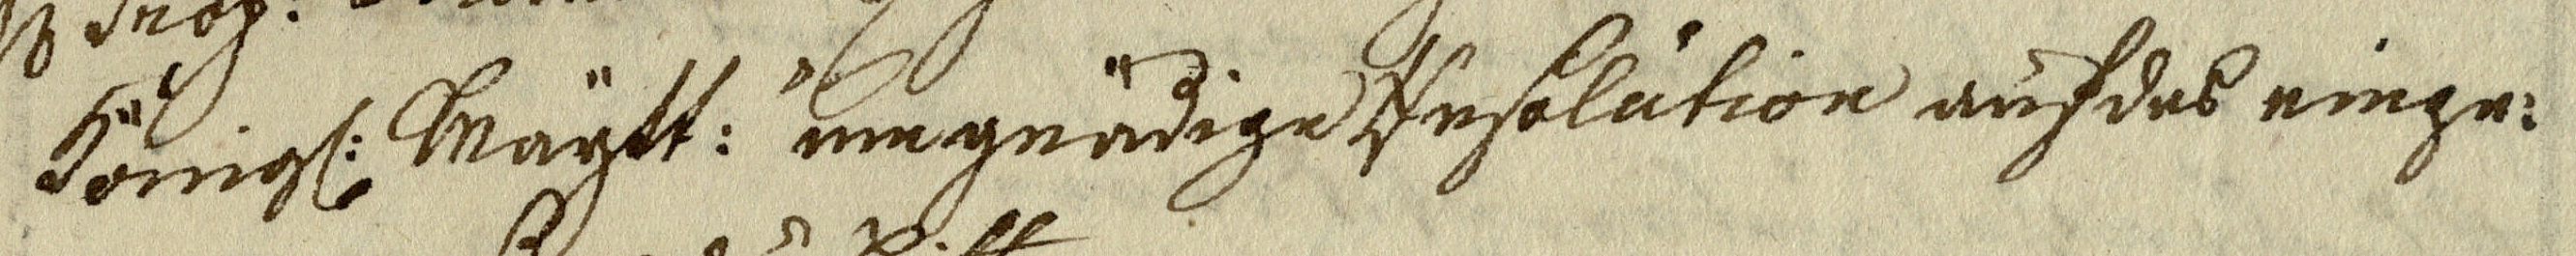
Königl. Maÿtt. um gnädige Resolution auf das einge¬
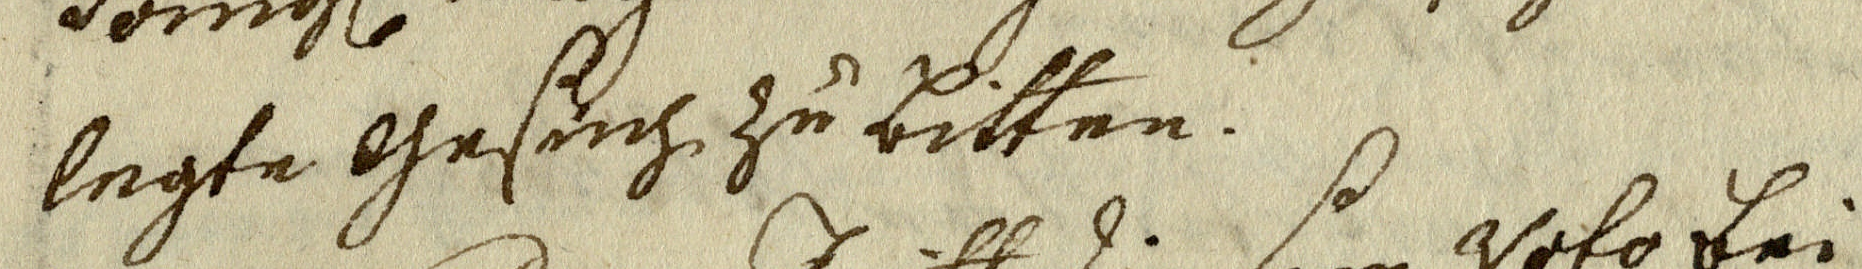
legte Gesuch zu bitten.
